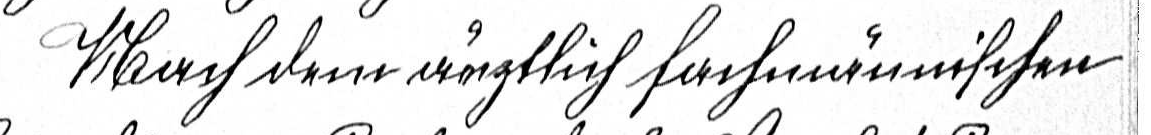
Nach dem ärztlich fachmännischen
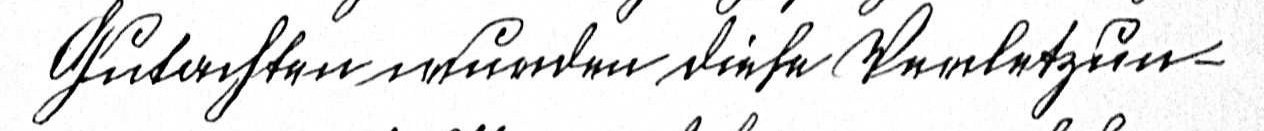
Gutachten wurden diese Verletzun¬
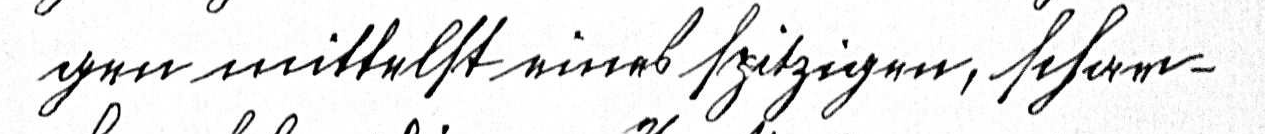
gen mittelst eines spitzigen, schar¬
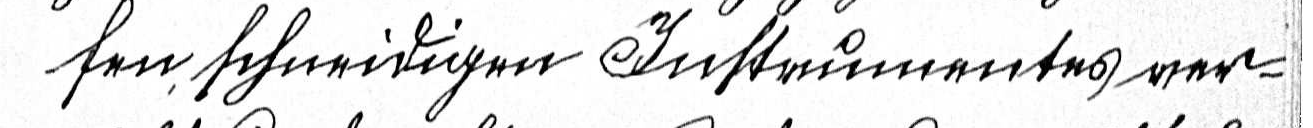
fen schneidigen Instrumentes ver¬
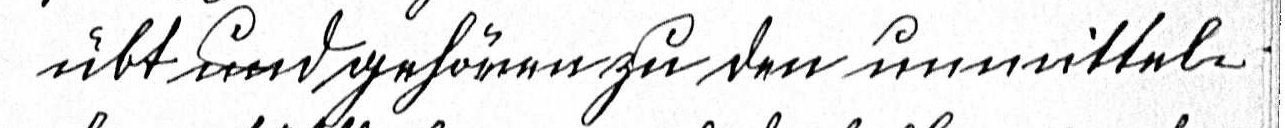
übt und gehören zu den unmittel¬
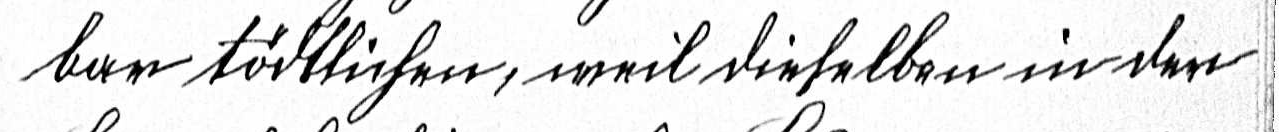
bar tödtlichen, weil dieselben in der
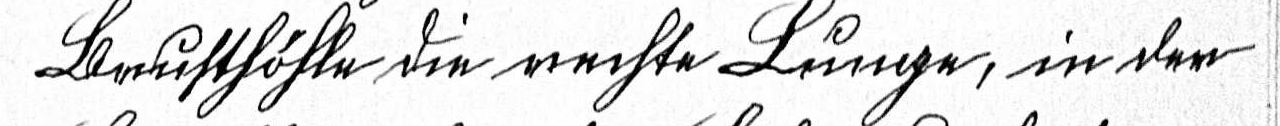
Brusthöhle die rechte Lunge, in der
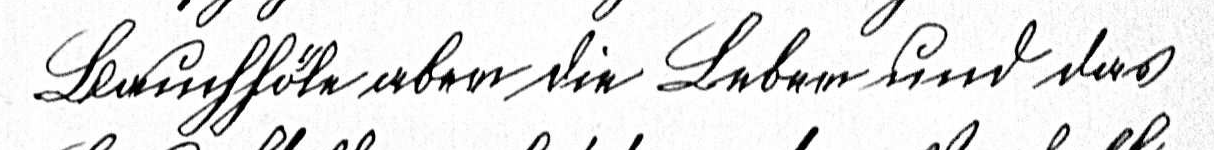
Bauchhöle aber die Leber und das
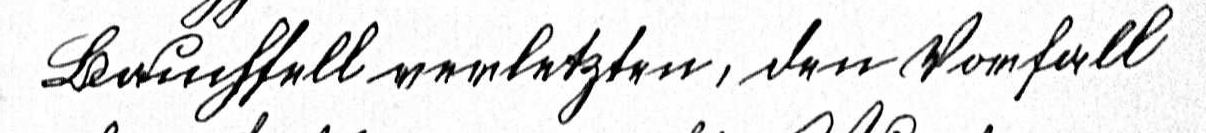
Bauchfell verletzten, den Vorfall
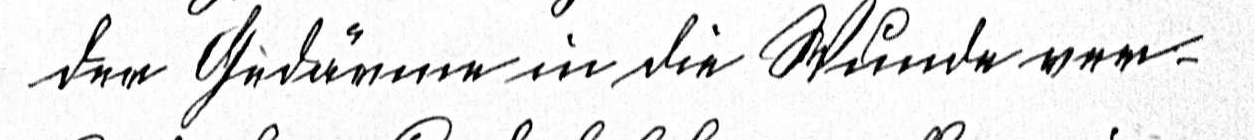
der Gedärme in die Wunde ver¬
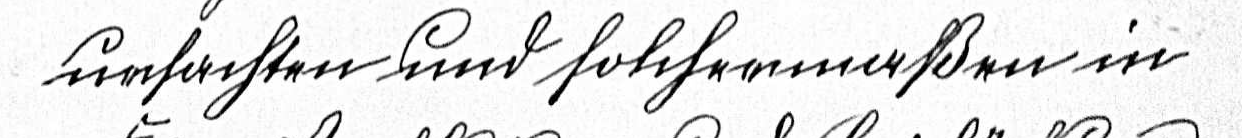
ursachten und solchermaßen in
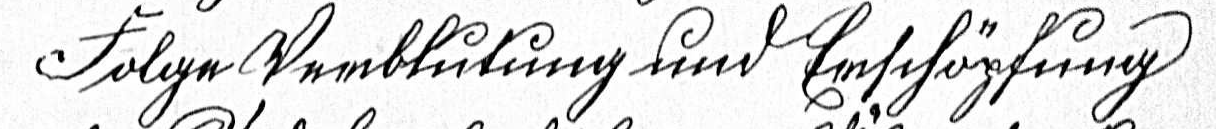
Folge Verblutung und Erschöpfung
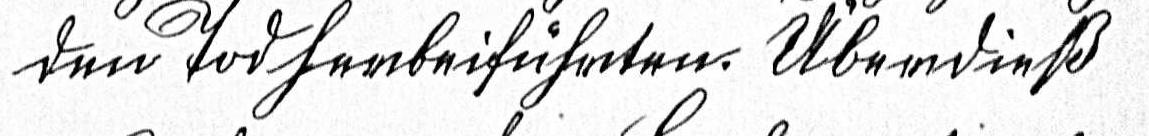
den Tod herbeiführten. Überdieß
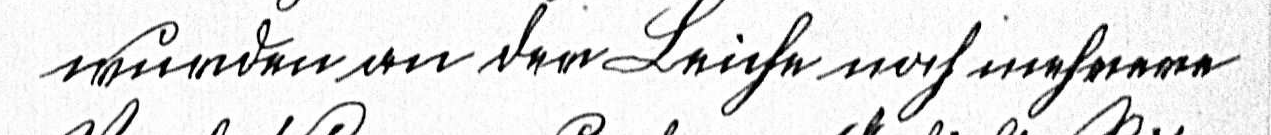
wurden an der Leiche noch mehrere
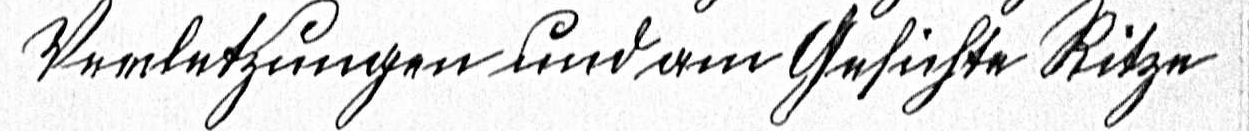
Verletzungen und am Gesichte Ritze
